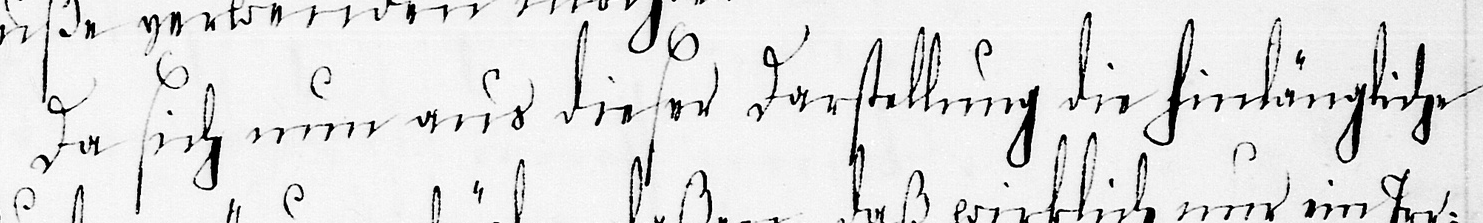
Da sich nun aus dieser Darstellung die hinlängliche
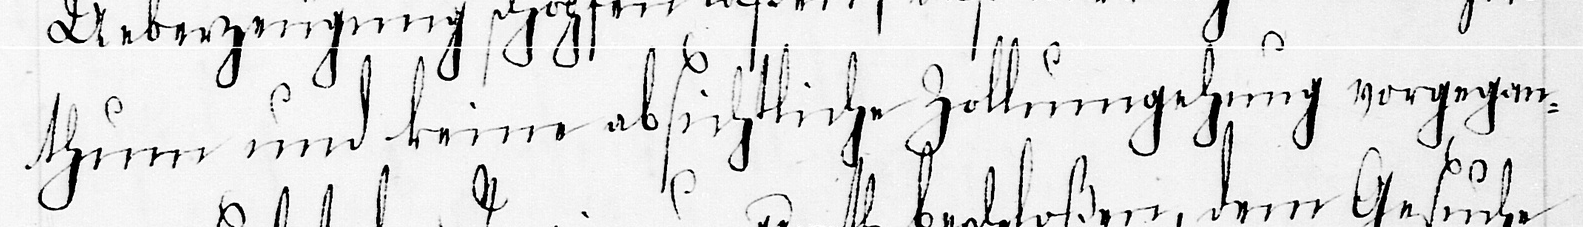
thum und keine absichtliche Zollumgehung vorgegan¬
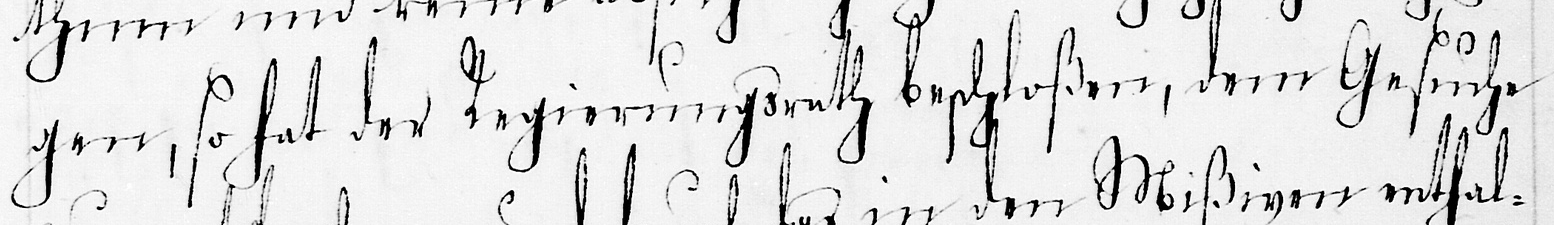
gen, so hat der Regierungsrath beschloßen, dem Gesuche
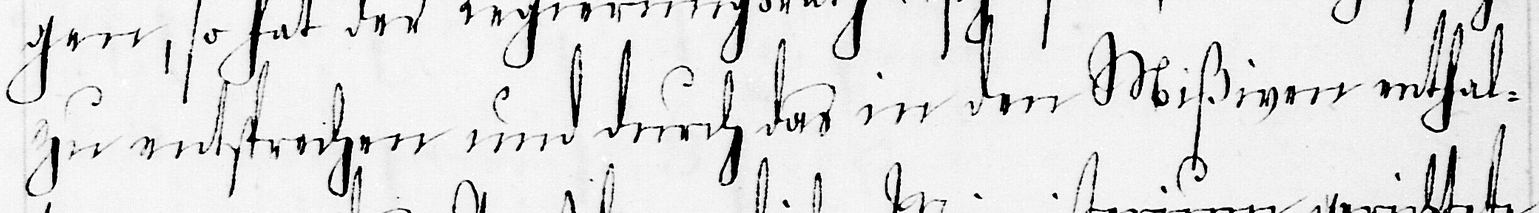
zu entsprechen und durch das in den Mißiven enthal¬
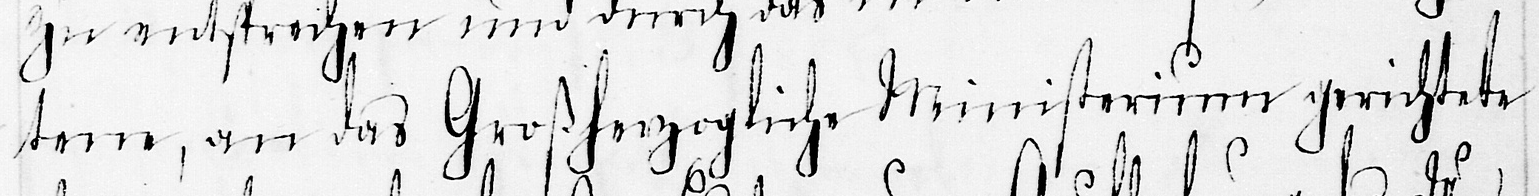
tene, an das Großherzogliche Ministerium gerichtete
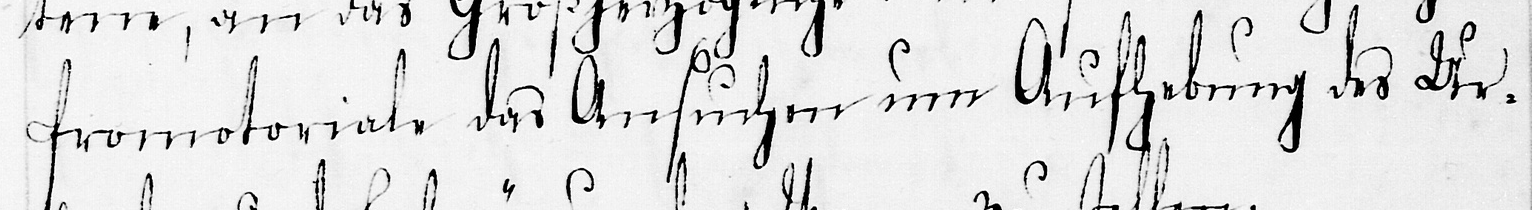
Promotoriale das Ansuchen um Aufhebung des Ur¬
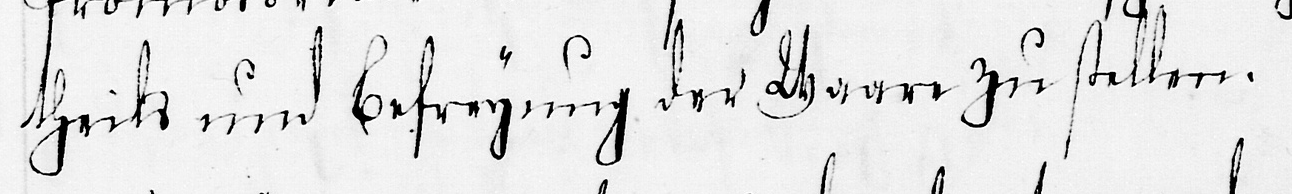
theils und Befreyung der Waare zu stellen.
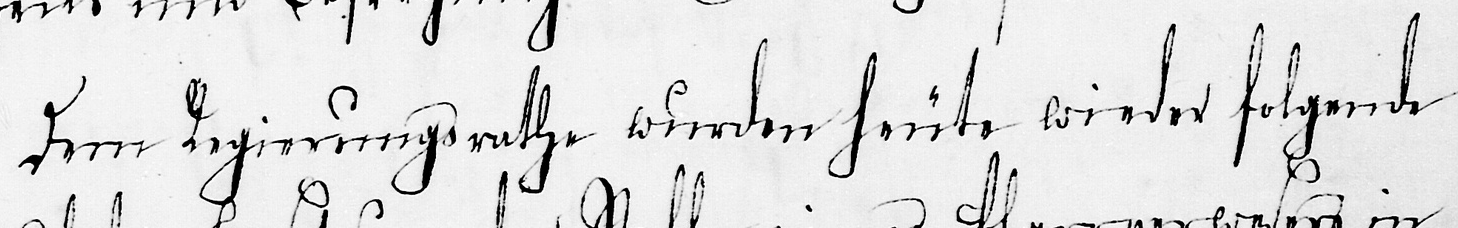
Dem Regierungsrathe wurden heute wieder folgende
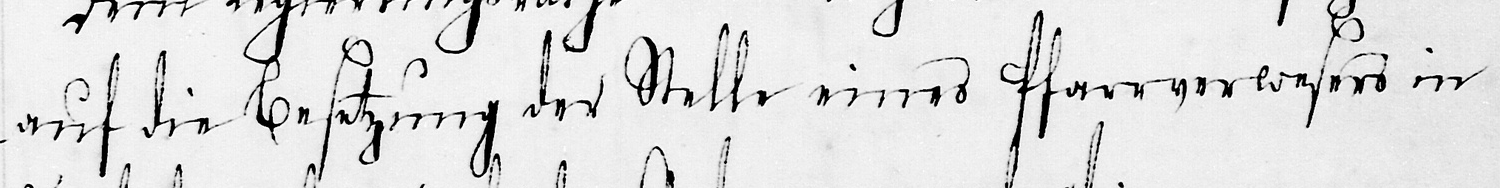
auf die Besetzung der Stelle eines Pfarrverwesers in
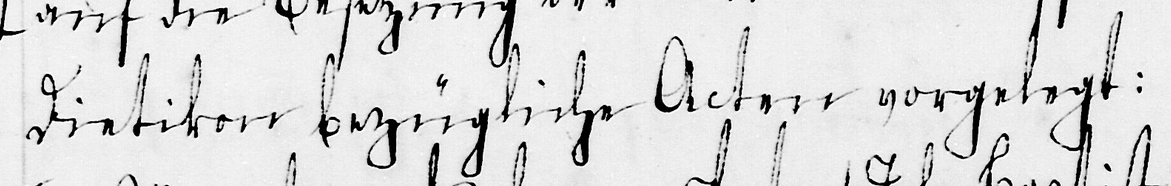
Dietikon bezügliche Acten vorgelegt:
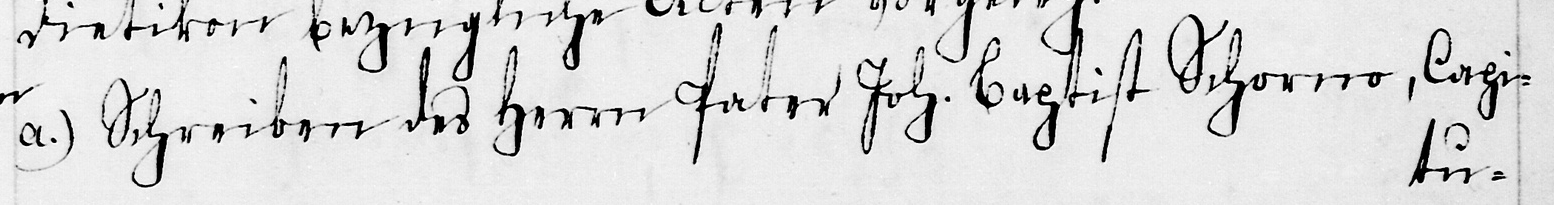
a.) Schreiben des Herrn Pater Joh. Baptist Schorno, Capi-
